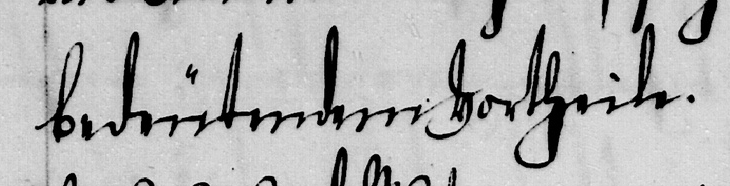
bedeutendem Vortheile.
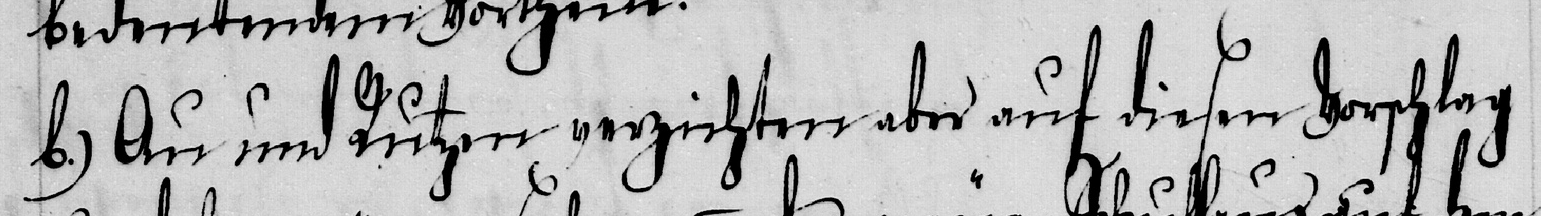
b.) Au und Rutzen verzichten aber auf diesen Vorschlag
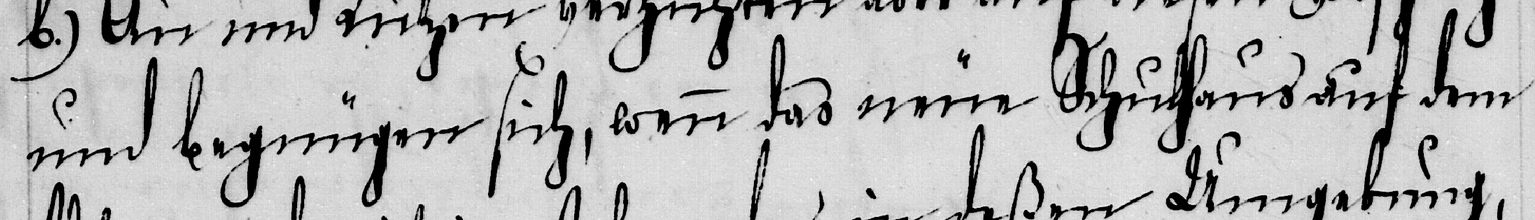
und begnügen sich, wenn das neue Schulhaus auf dem
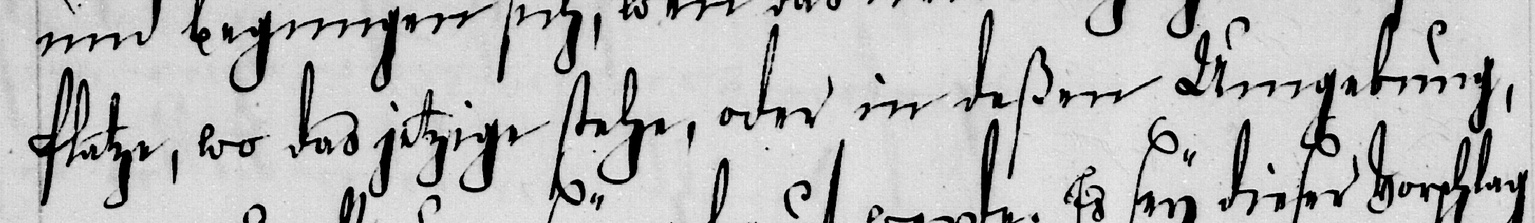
Platze, wo das jetzige stehe, oder in deßen Umgebung,
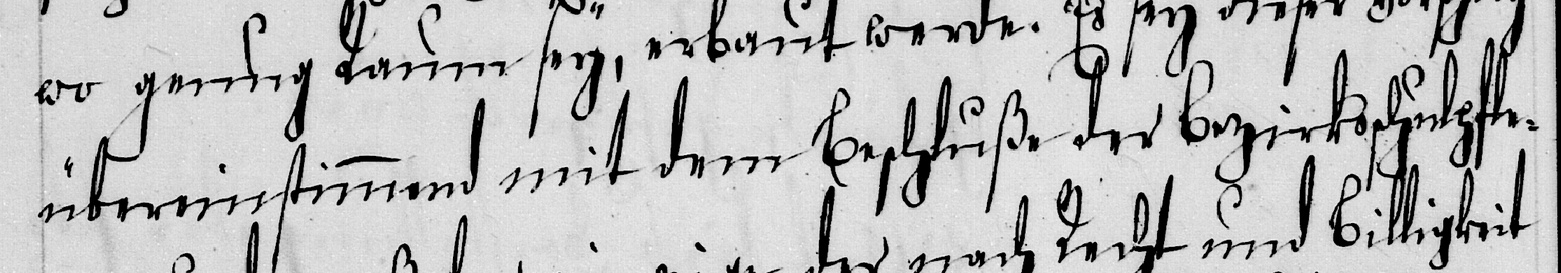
übereinstimmend mit dem Beschluße der Bezirksschulpf¬
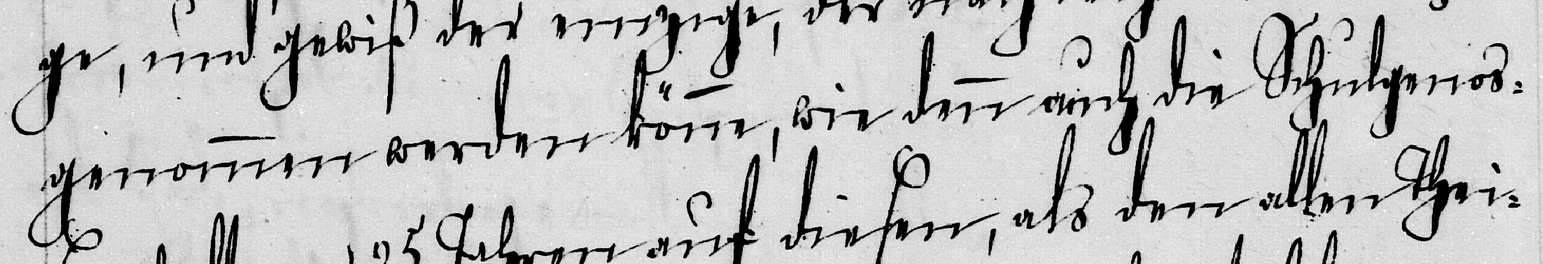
genommen werden könne, wie denn auch die Schulgenoß¬
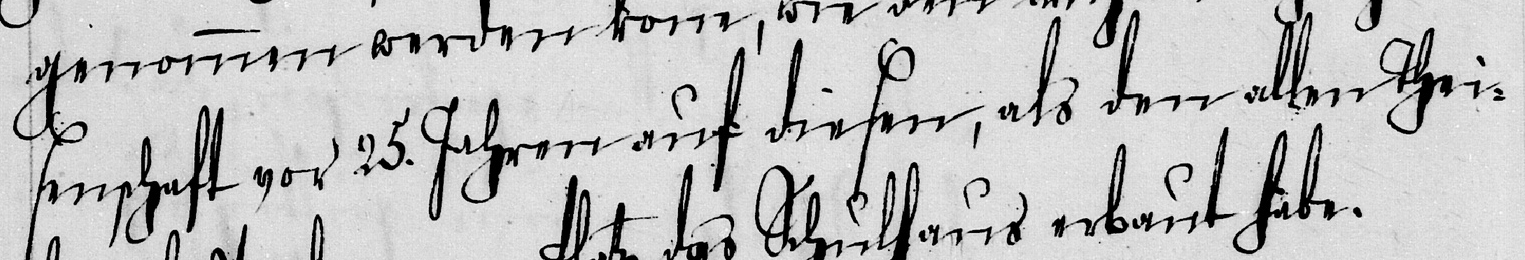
enschaft vor 25. Jahren auf diesen, als den allen Thei¬
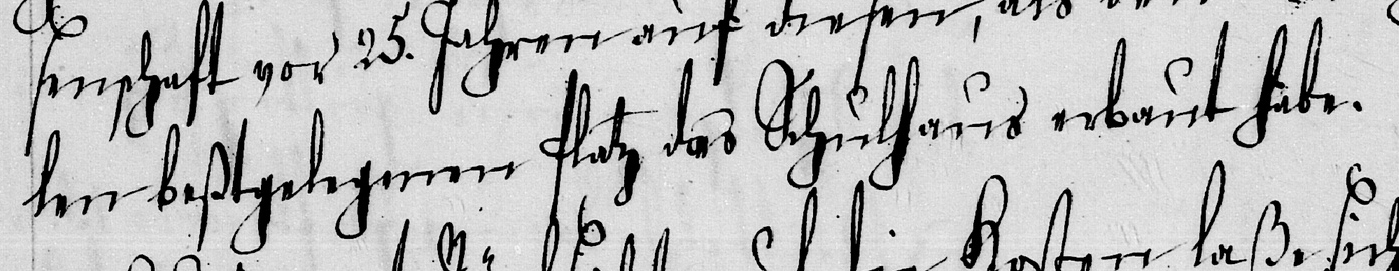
len bestgelegenen Platz das Schulhaus erbaut habe.
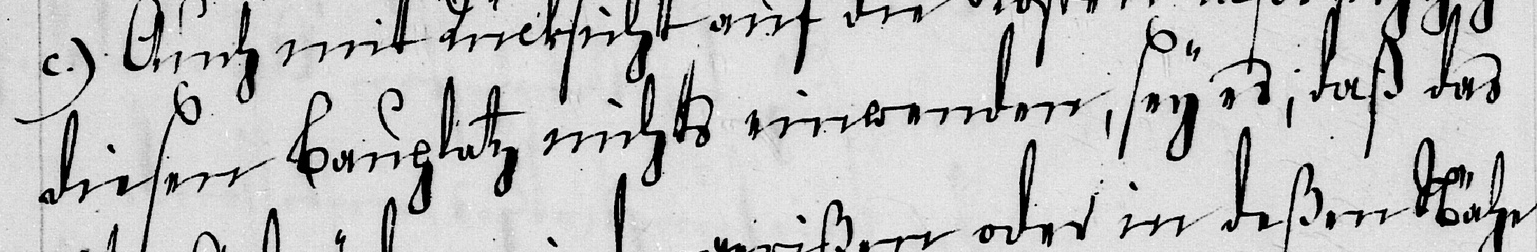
diesen Bauplatz nichts einwenden, sey es, daß das
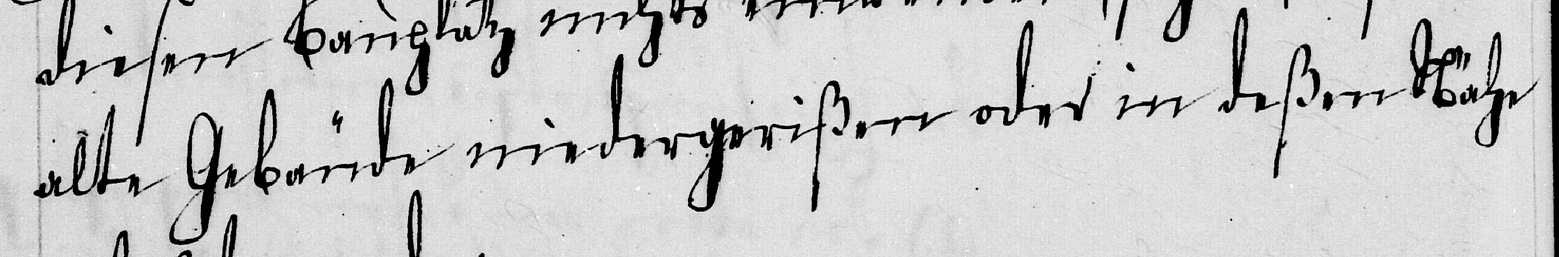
alte Gebäude niedergerißen oder in deßen Nähe
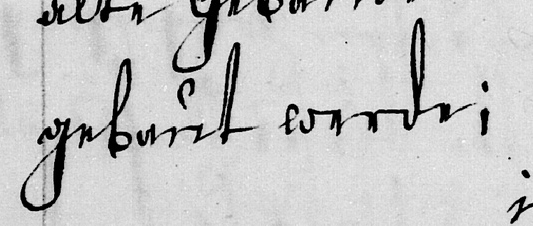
gebaut werde;
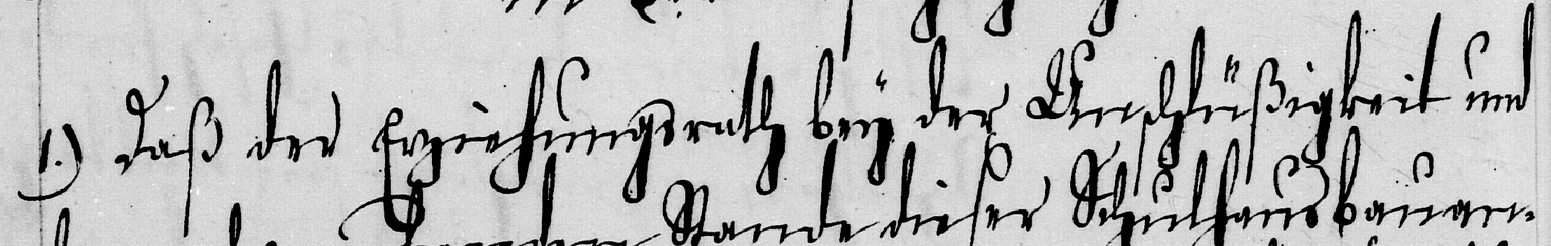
1.) Daß der Erziehungsrath bey der Unschlüßigkeit und
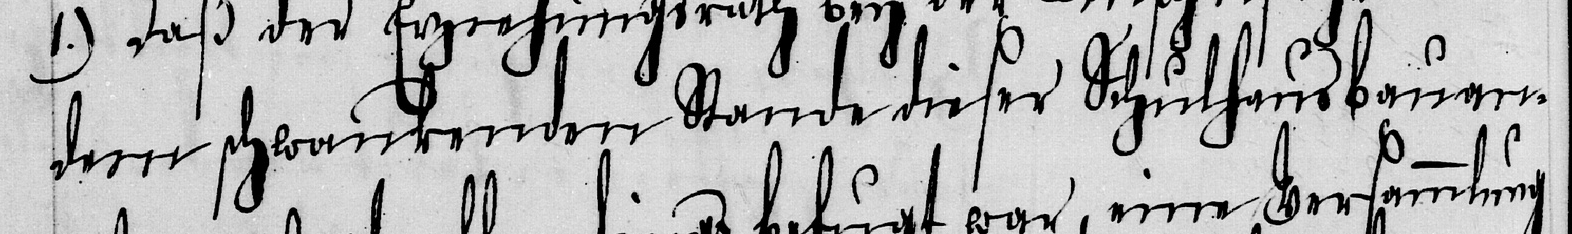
dem schwankenden Stande dieser Schulhausbauan¬
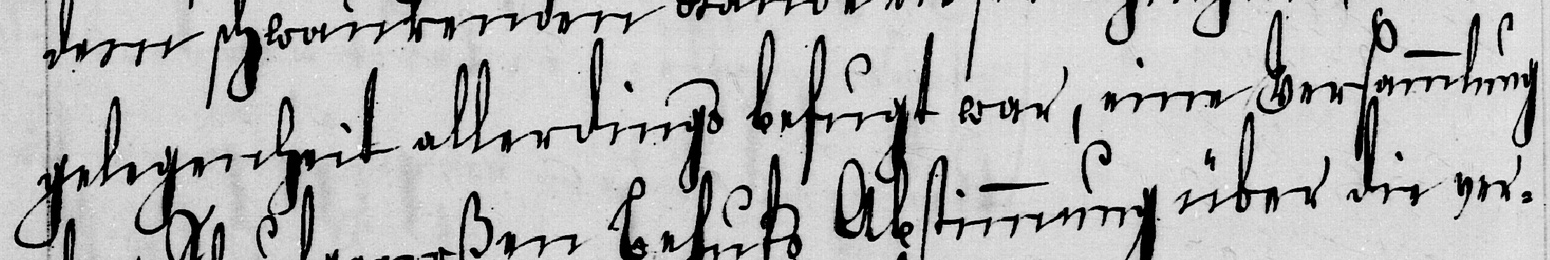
gelegenheit allerdings befugt war, eine Versammlung
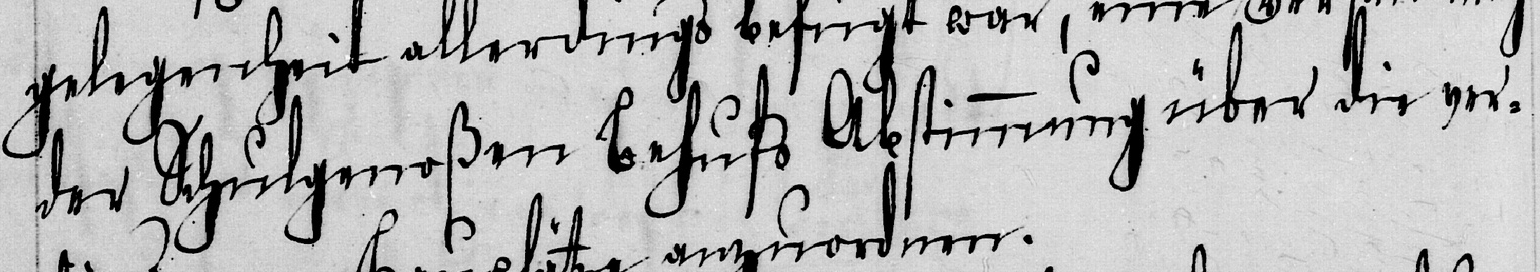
der Schulgenoßen Behufs Abstimmung über die ve¬
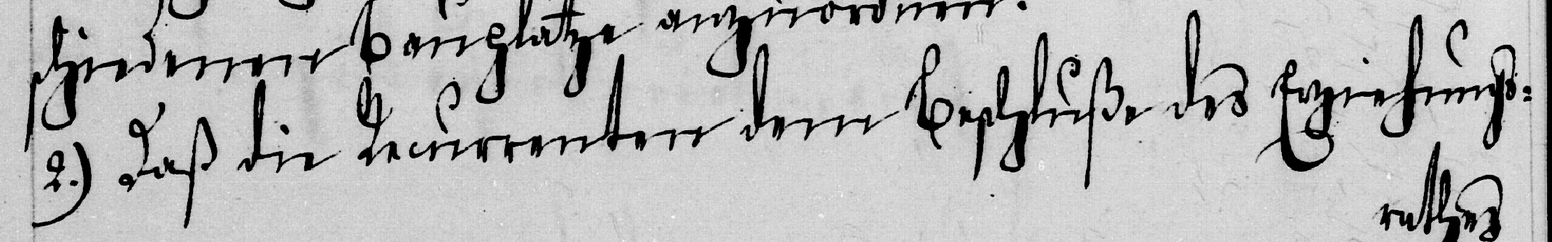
2.) Daß die Recurrenten dem Beschluße des Erziehungs-
